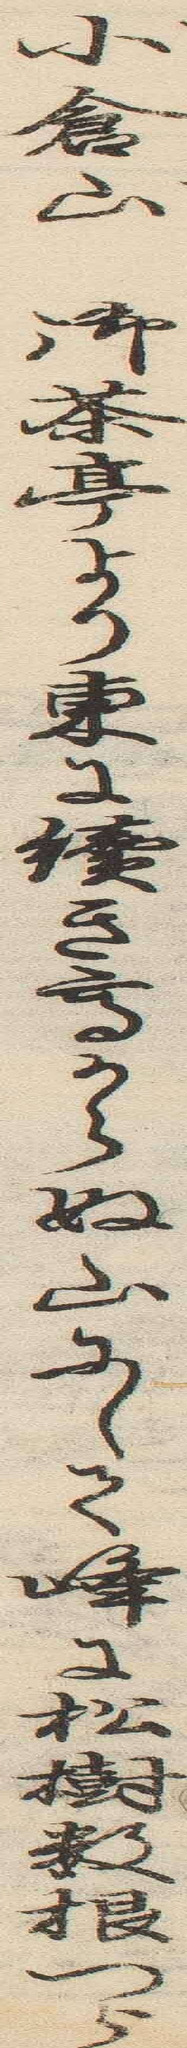小倉山御茶亭より東に續き高からぬ山にして峰に松樹数根つら
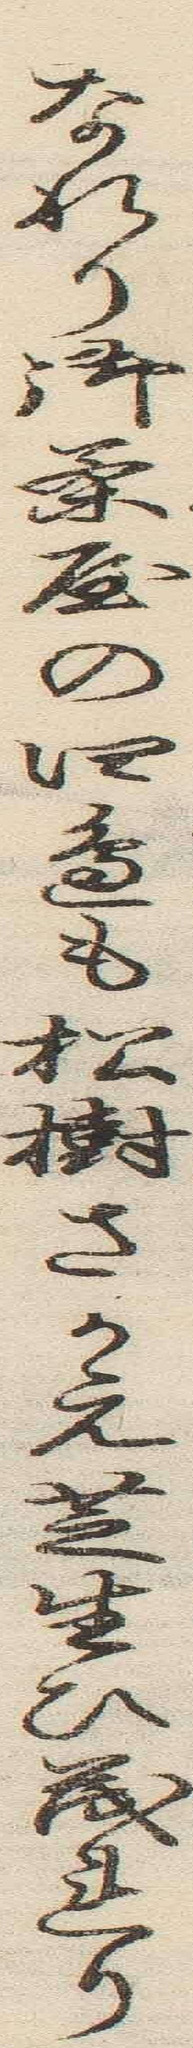なれり御茶屋の四邊も松樹さかえ芝生ひ茂れり
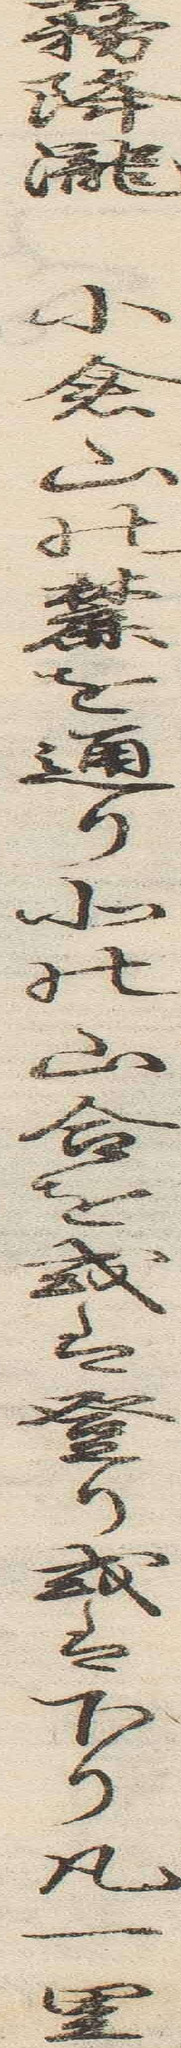霧降瀧小倉山の麓を通り北の山合を或は登り或は下り凡一里
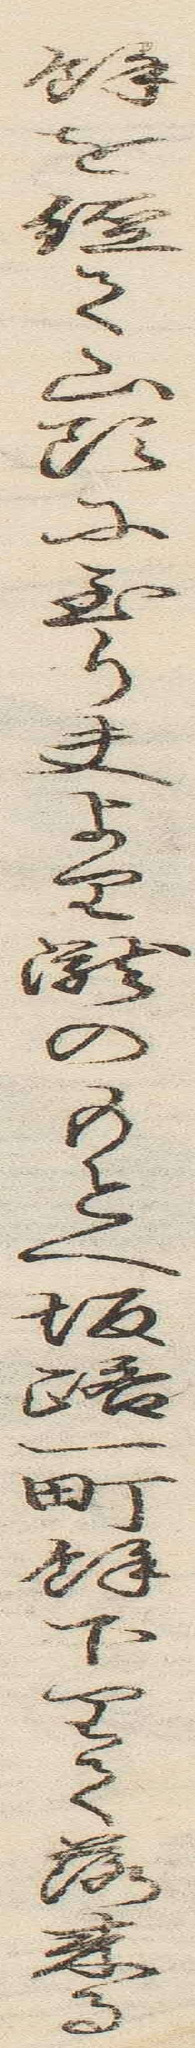餘を經て山頭に至り夫より瀧のもとへ坂路一町餘下りて落來る
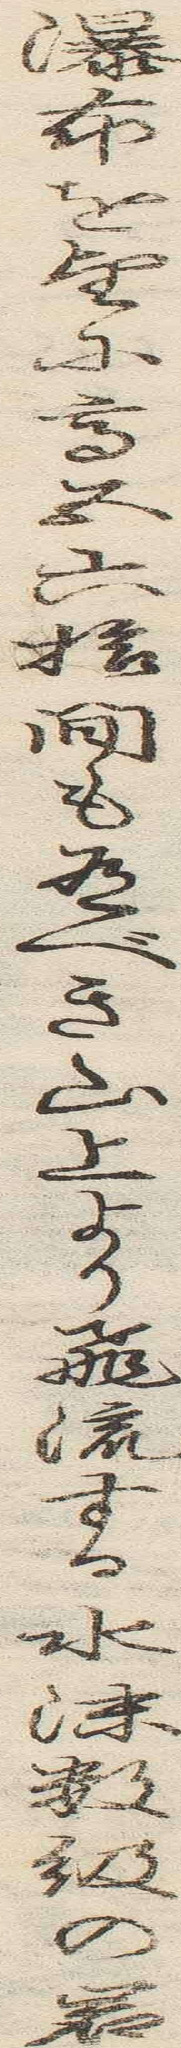瀑布を望に高五六拾間も有べき山上より飛流する水沫数級の岩
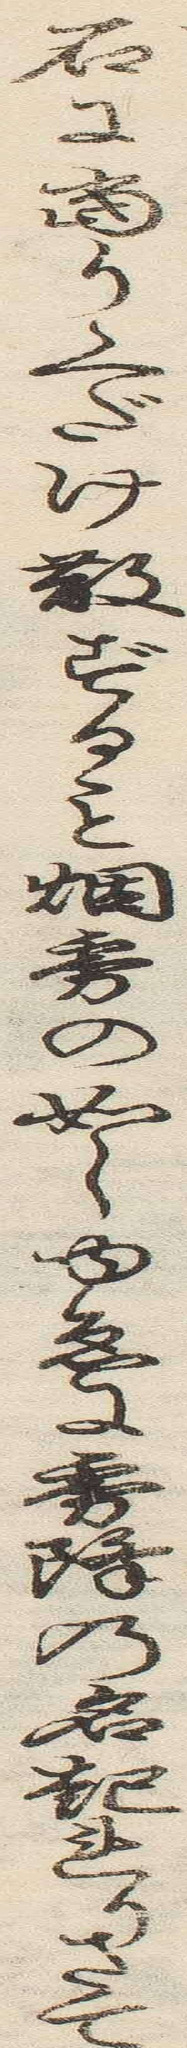石に當りくだけ散ずること烟雾の如しゆゑに雾降の名起れりさて
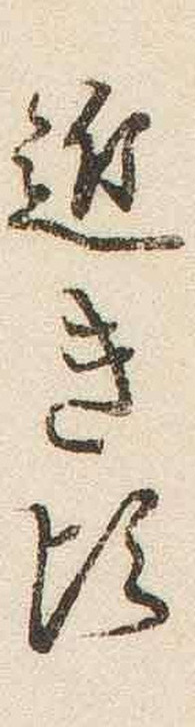近き頃
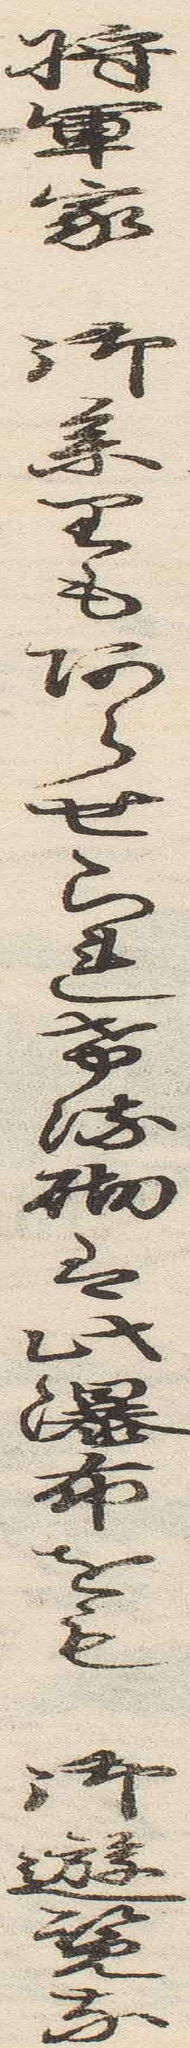将軍家御参りもあらせられける砌は此瀑布をも御遊覧な
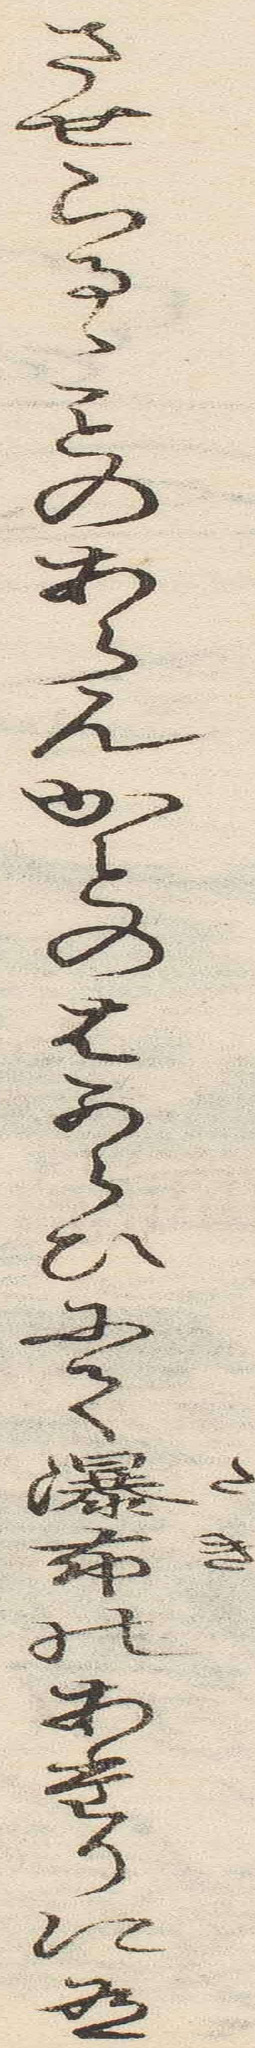させらるゝことのあらんかとのはからひにて瀑布のあたりに有
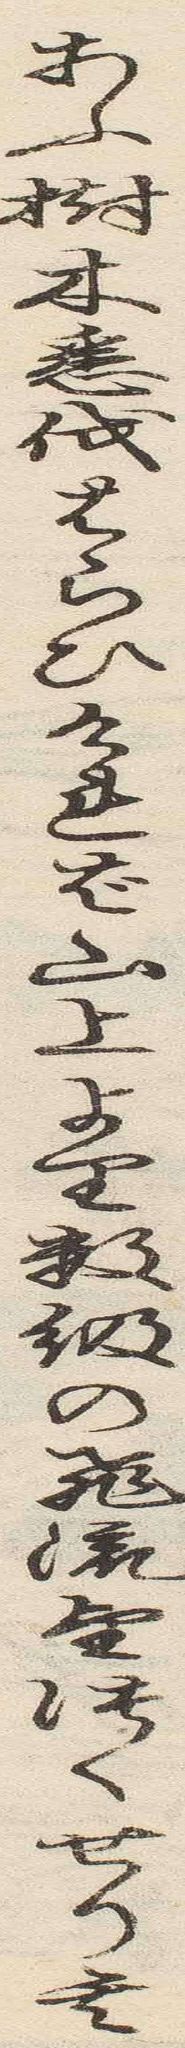あふ樹木悉伐はらひければ山上より数級の飛流望つくせり其
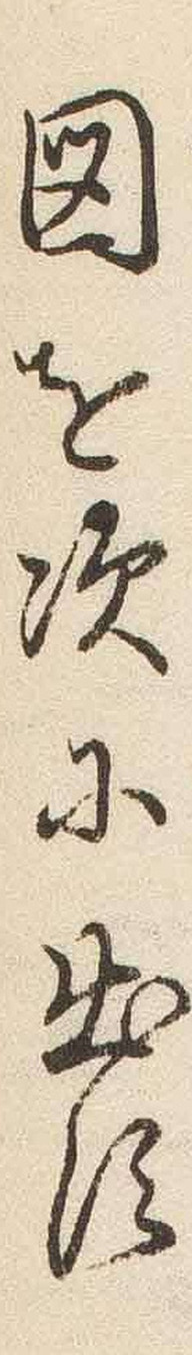図を次に出す
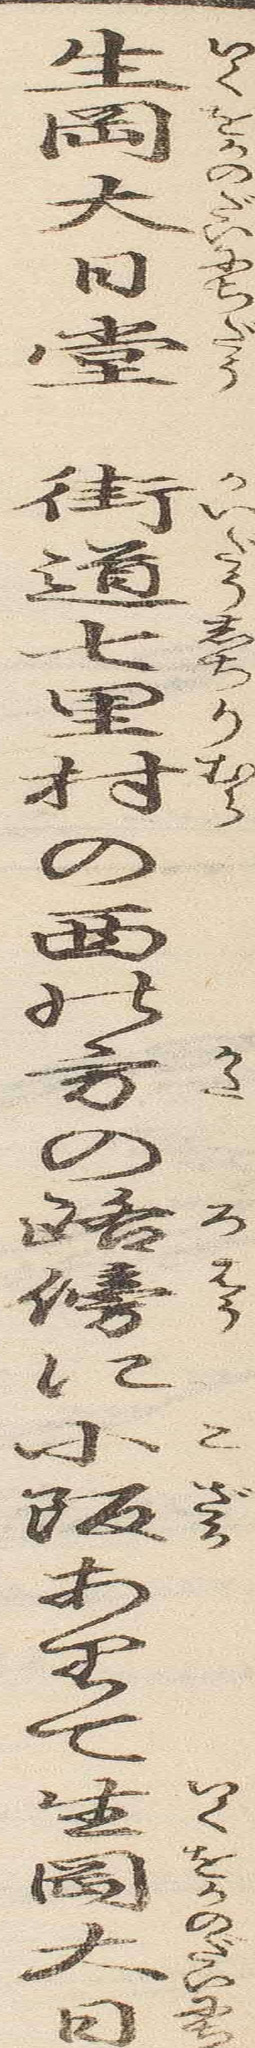生岡大日堂街道七里村の西の方の路傍に小阪ありて生岡大日
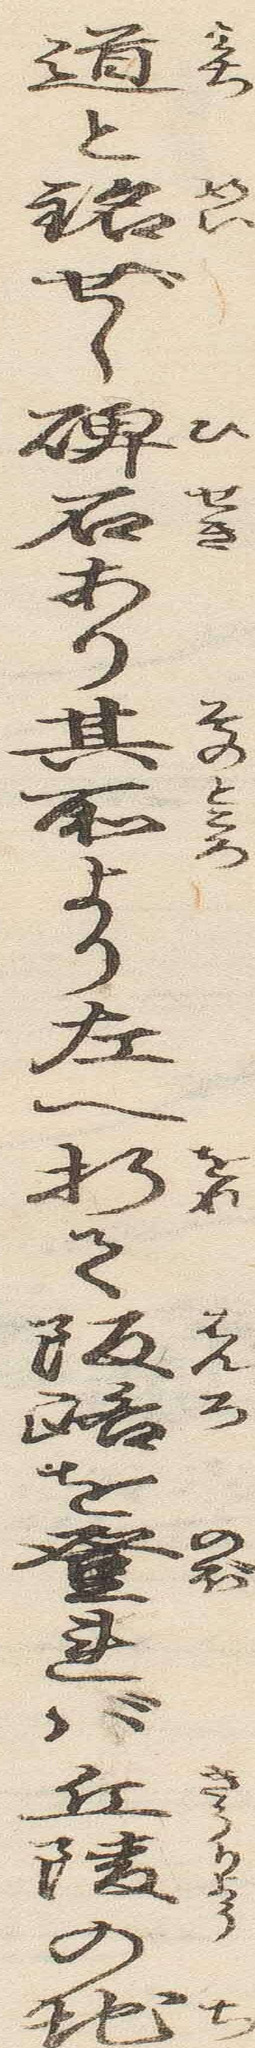道と銘ぜし碑石あり其所より左へ折て阪路を登れば丘陵の地
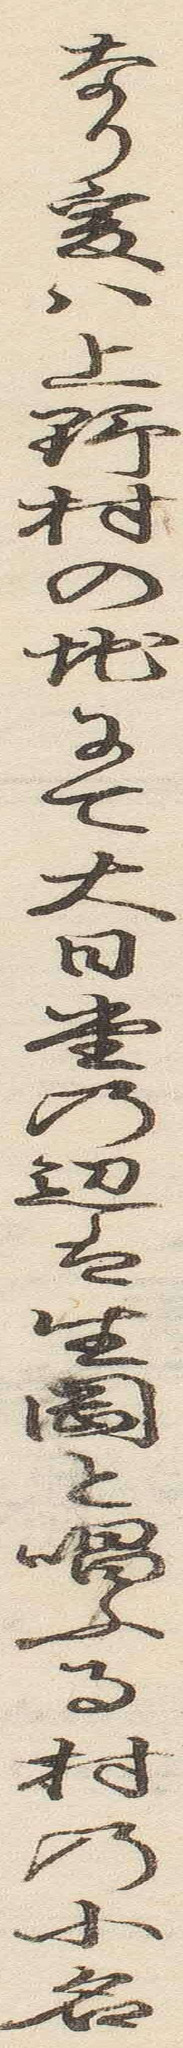なり爰は上野村の地にて大日堂の辺は生岡と唱ふる村の小名
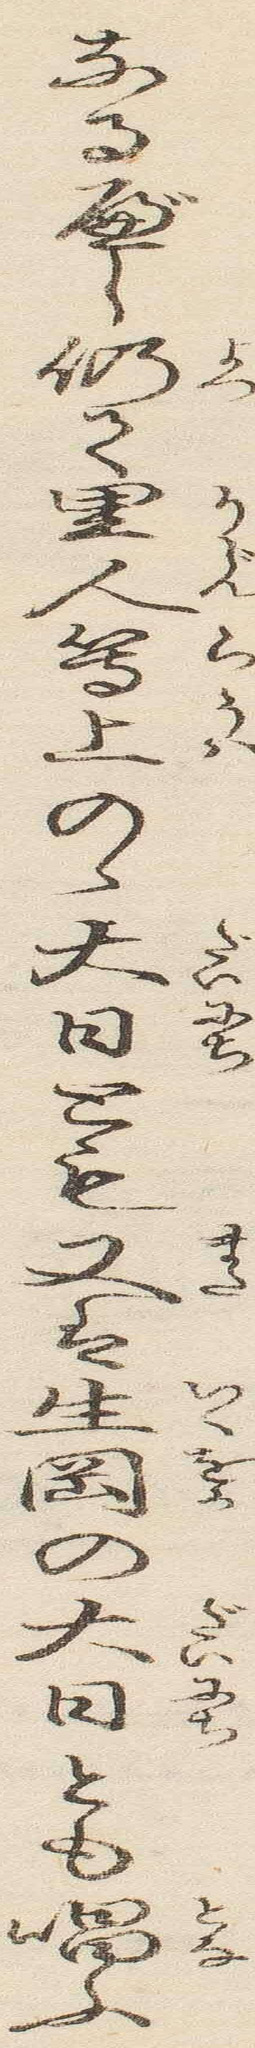なるべし仍て里人等上のゝ大日とも又は生岡の大日とも唱ふ
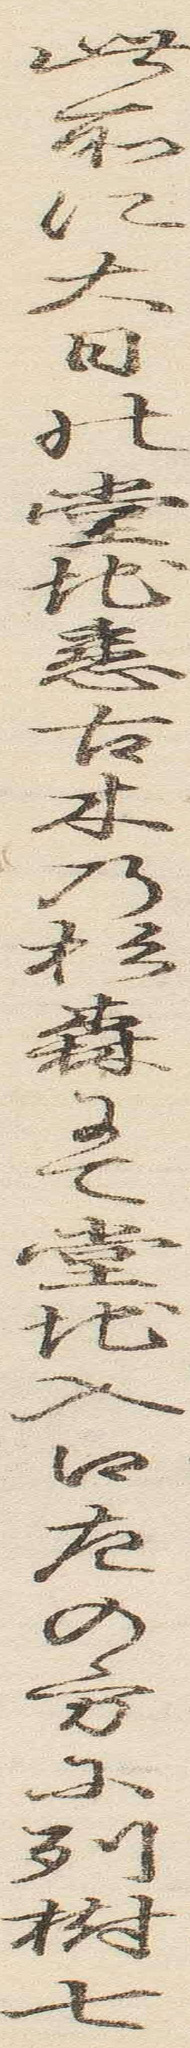此所に大日の堂地悉古木の杉森にて堂地入口左の方に列樹七
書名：日光山志
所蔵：東京学芸大学附属図書館 国文学研究資料館
